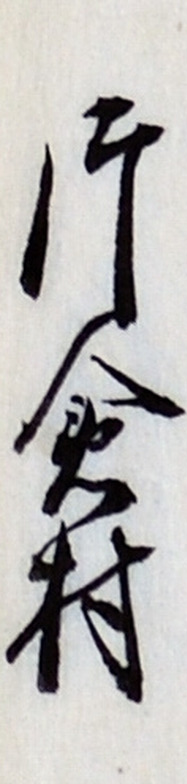片倉村
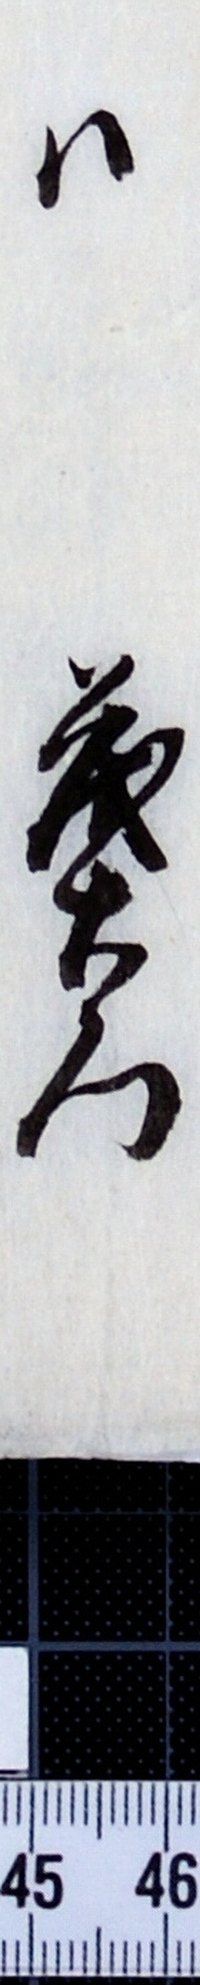同茂右衛門
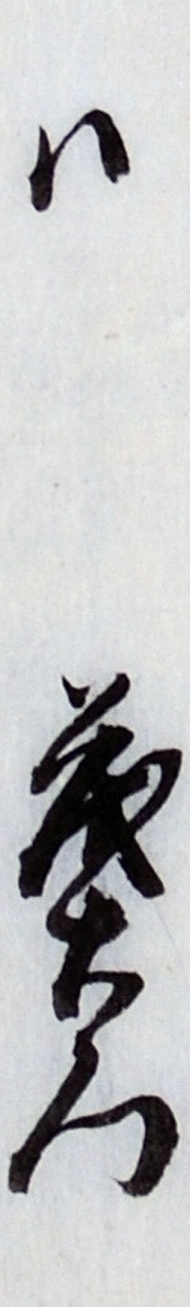同茂右衛門
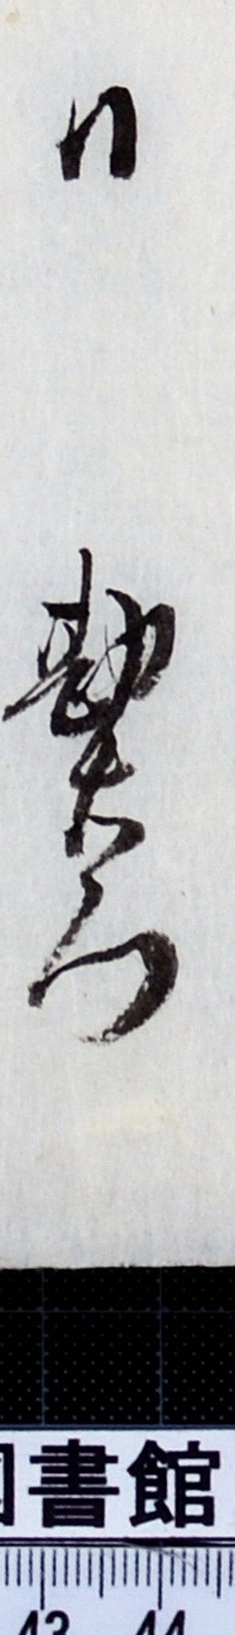同勘右衛門
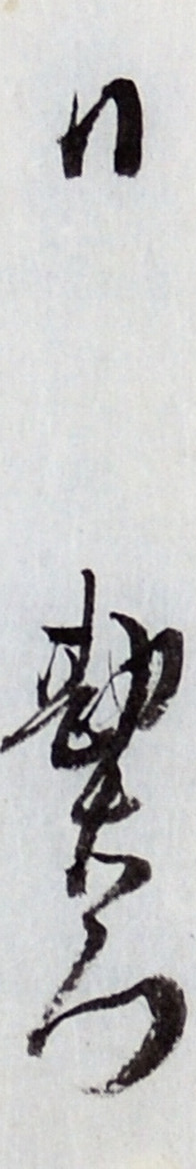同勘右衛門
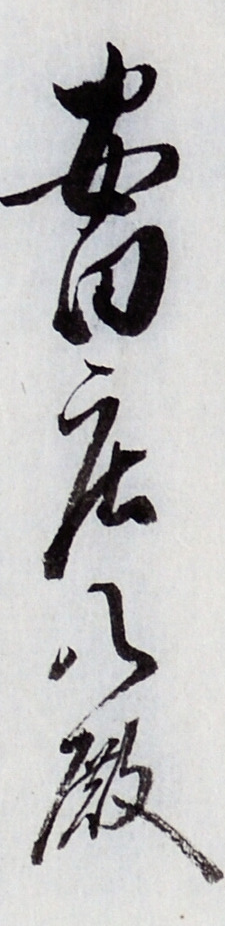安田庄八殿
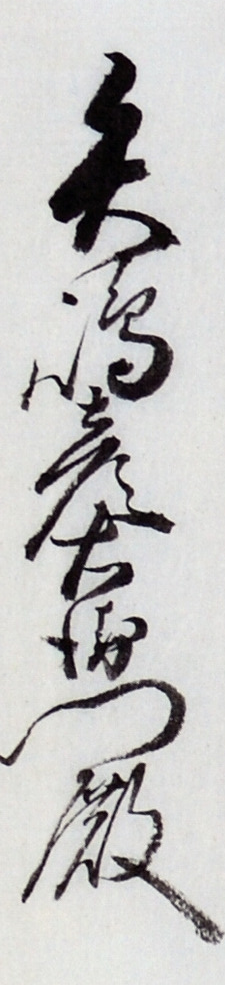矢嶋彦右衛門殿

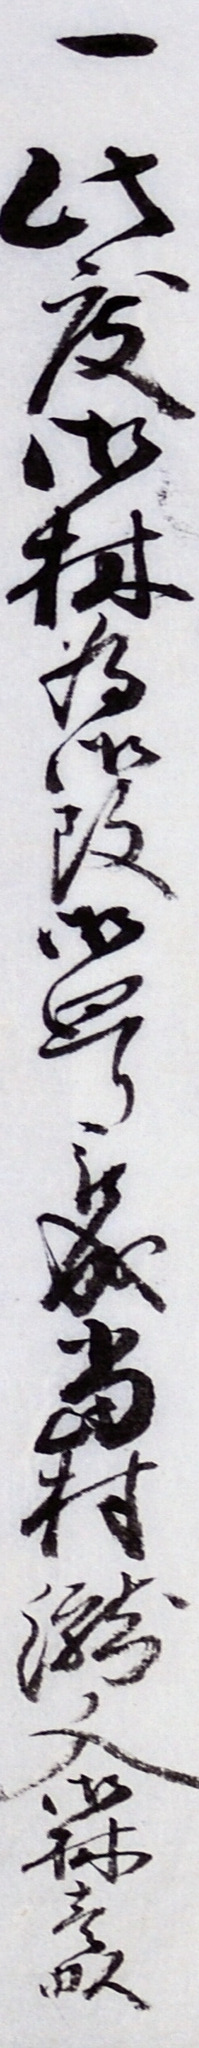一此度御林為御改御廻り被成当村瀧ノ入御林壱畝
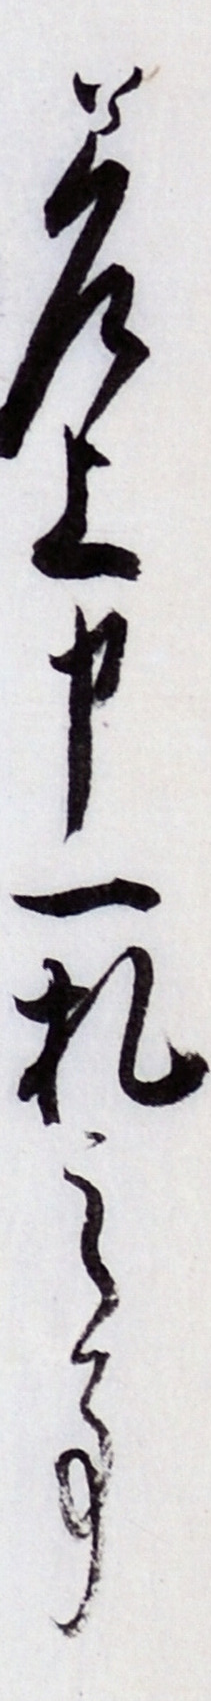差上申一札之事
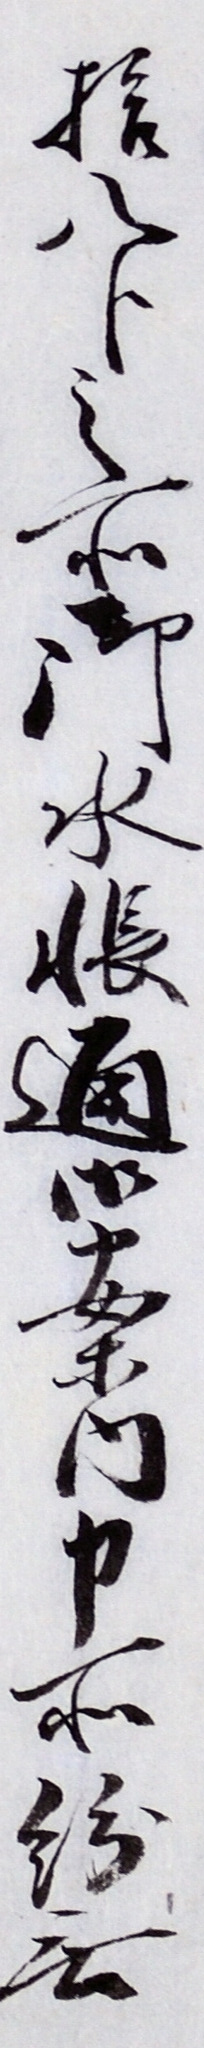拾八分之所御水帳通御案内申所紛無
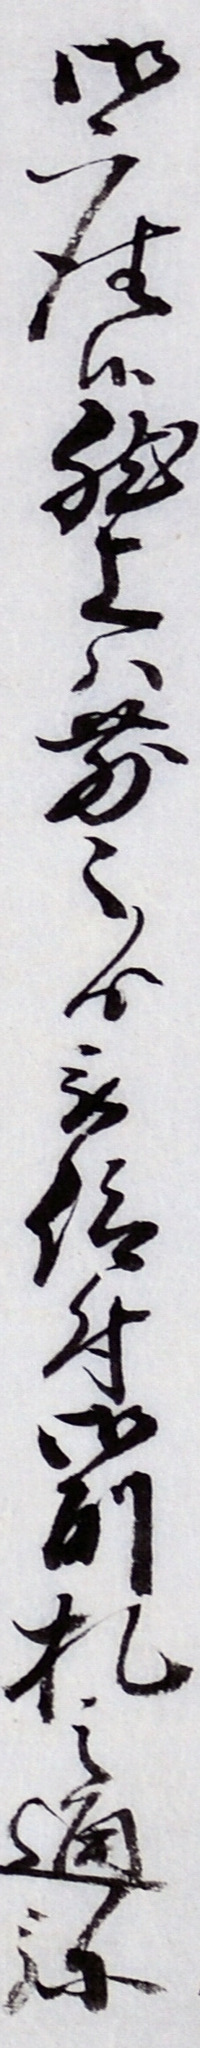御座候然上ハ前々ゟ被仰付御制札之通弥
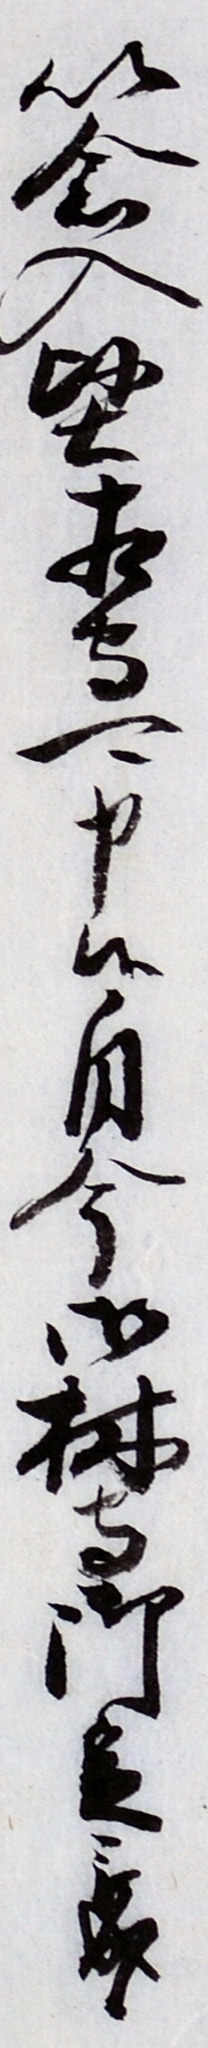以念入堅相守可申候自今御林守御立被成候
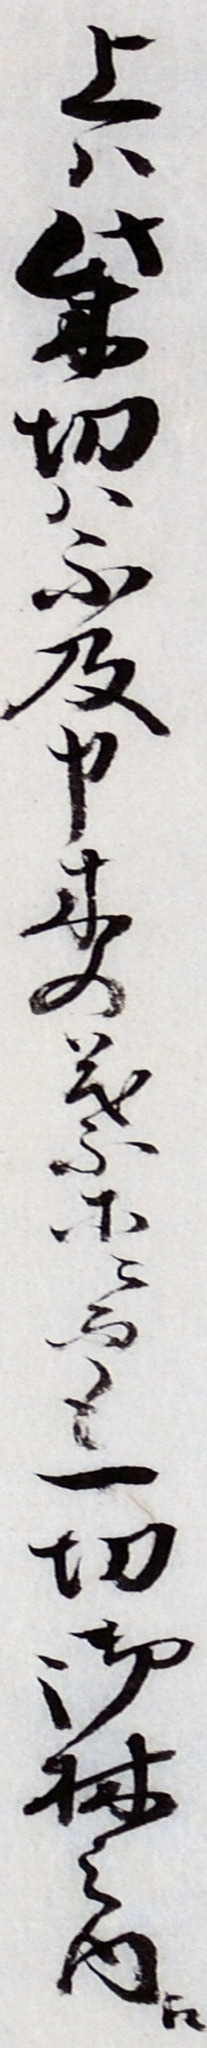上ハ柴切ハ不及申木の葉等ニ而も一切御林之内江え
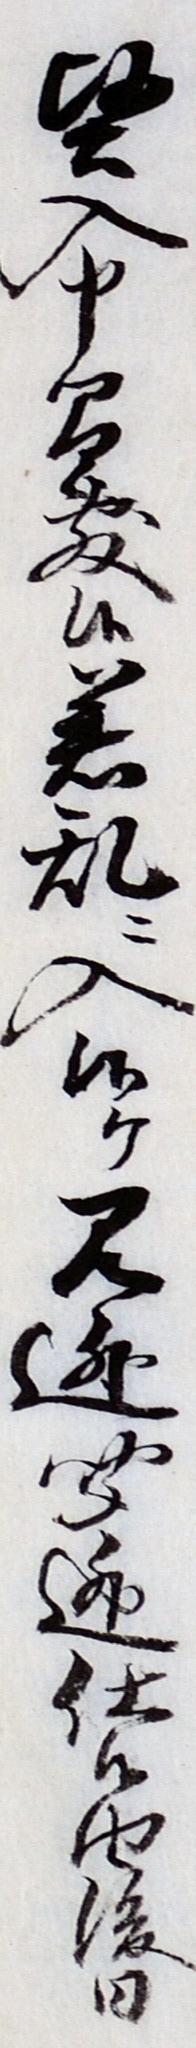堅入申間敷候若乱ニ入候ヶ見逃聞逃仕候由後日
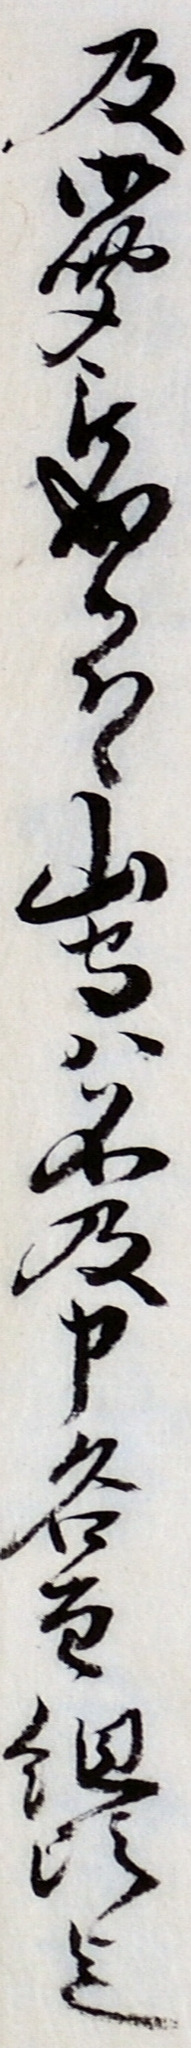及御聞被成候ハヽ山守ハ不及申名主組頭迄
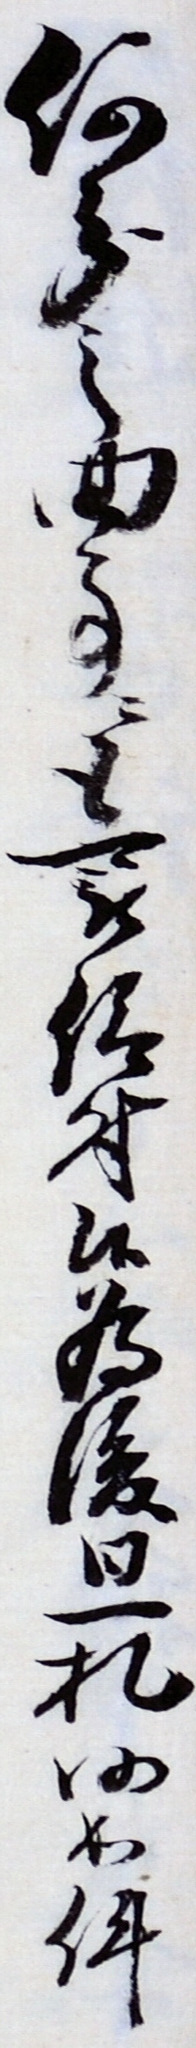何分之曲事ニも可被仰付候為後日一札仍如件
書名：御林御竹藪証文控
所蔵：伊那市立高遠町図書館・合同会社AMANE
